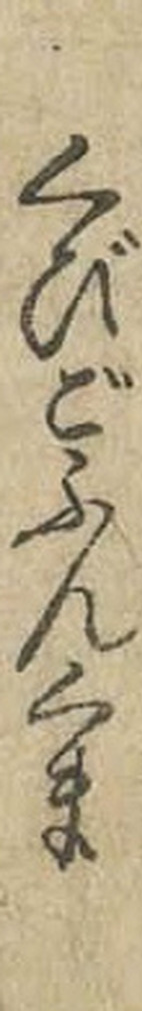くびごふんくま
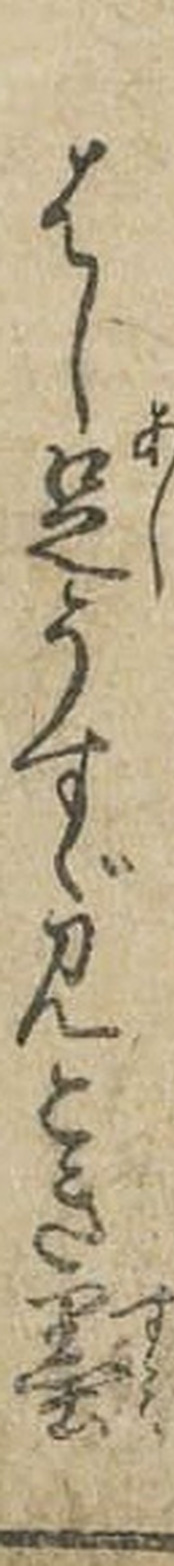はし足うすゞみこき墨
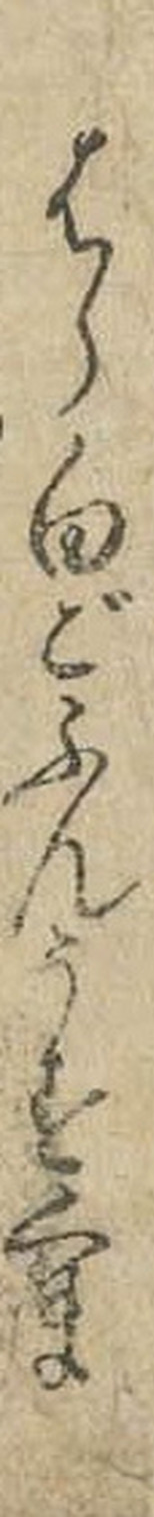はら白ごふんうすくま
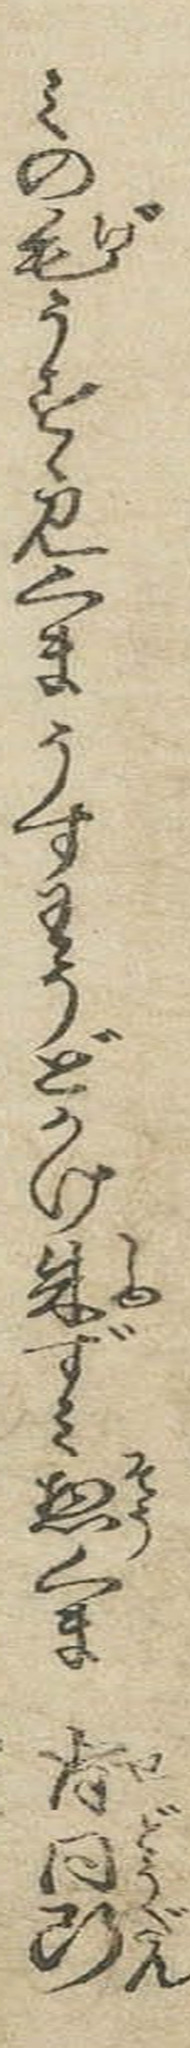みの毛うすゝみくまうすわうどかけ朱ずみ総くま背同断
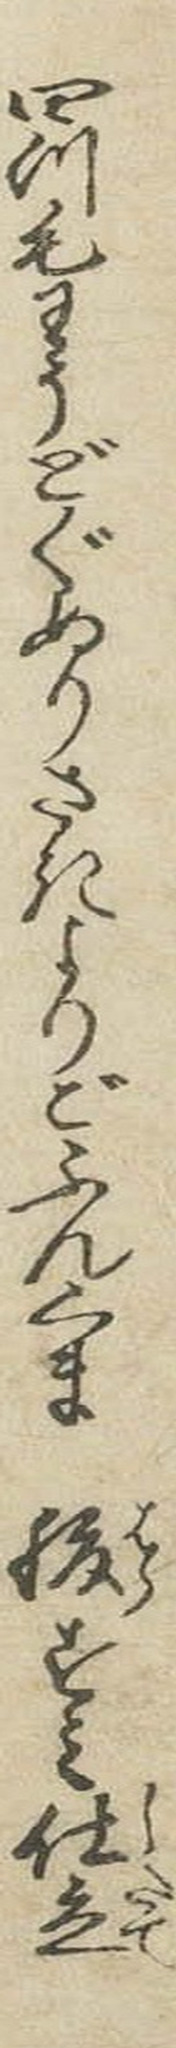四つ毛わうどぐぬりさきよりごふんくま腹すみ仕立
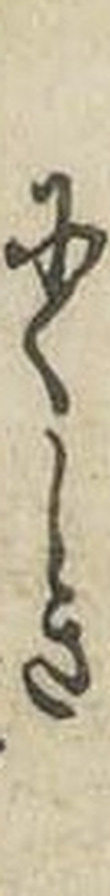にくしき
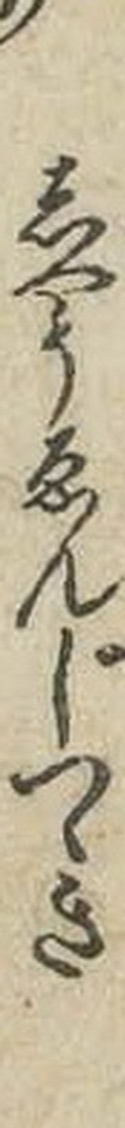しやうゑんじつゝき
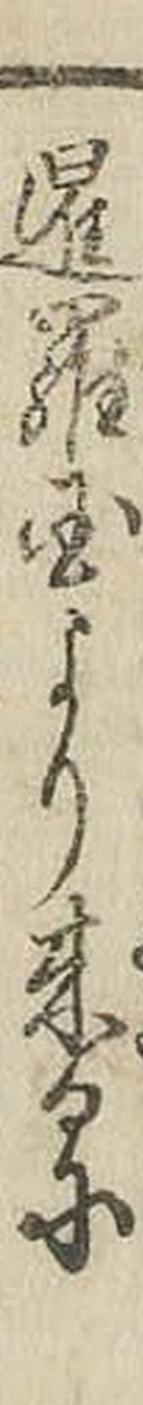暹羅国より来るに
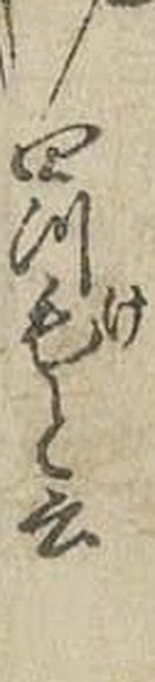四つ毛と云
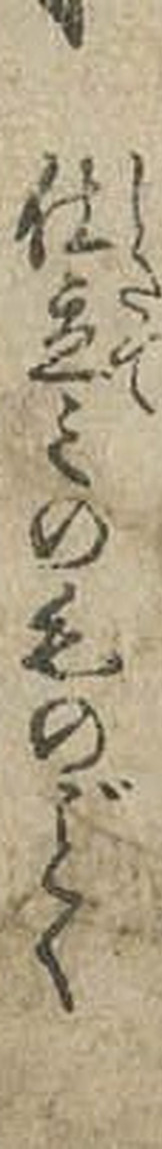仕立みの毛のごとく
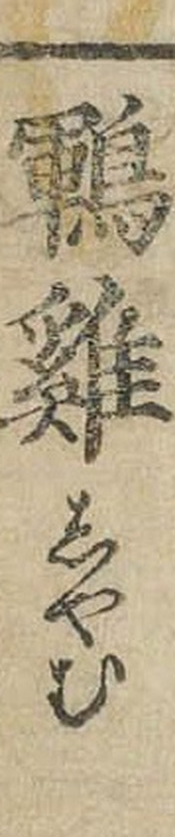鶤雞しやむ

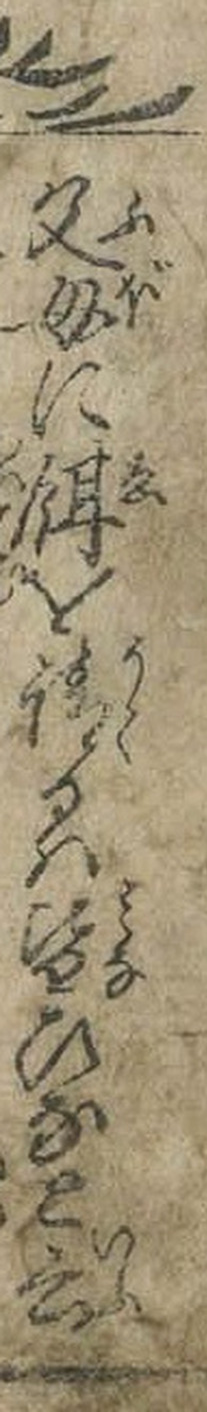父母に餌を請るは皆ひなと云
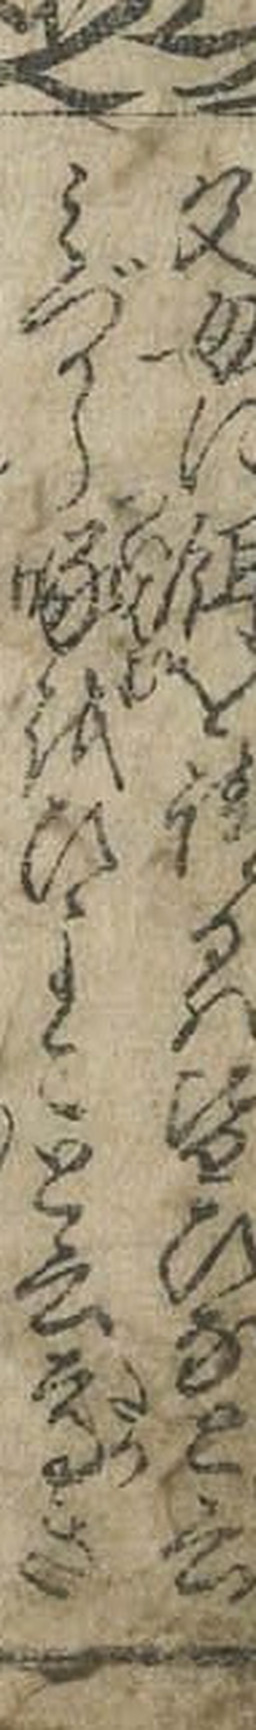みづから啄をひよこと云高き
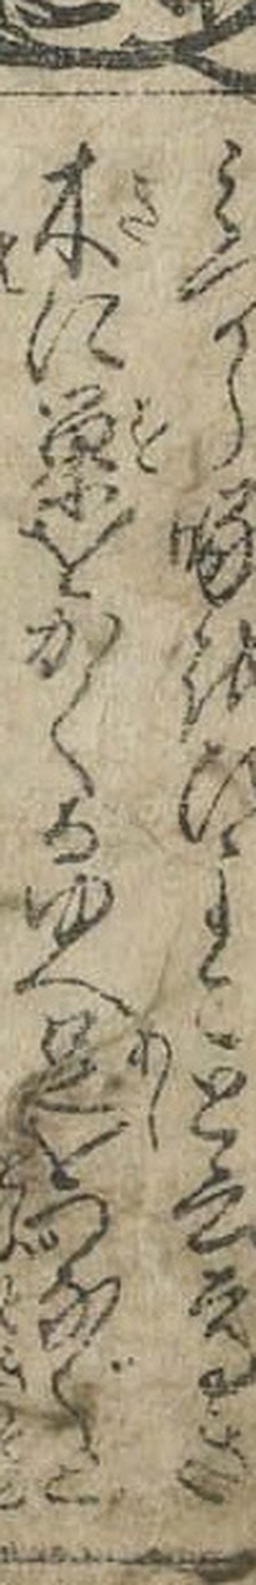木に巣をかくるゆへ足をつなぐと
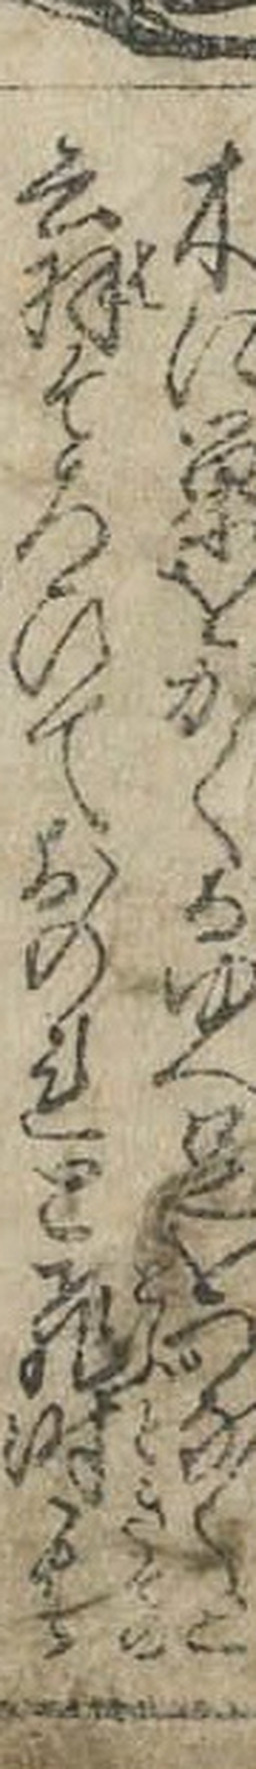云羽そろひておのれと飛時其
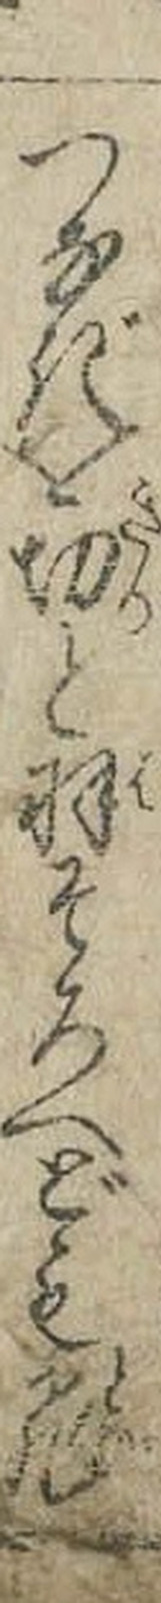つなぎを切と羽そろへども飛
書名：絵本写宝袋 9巻 8之巻
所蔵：東京学芸大学教育コンテンツアーカイブ
